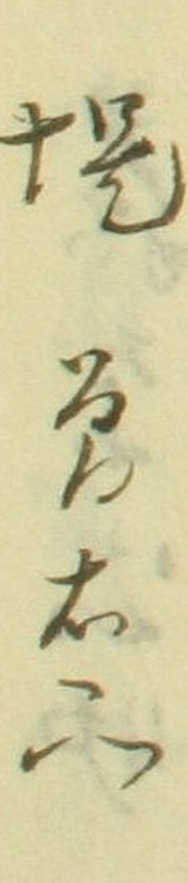畑小右衛門
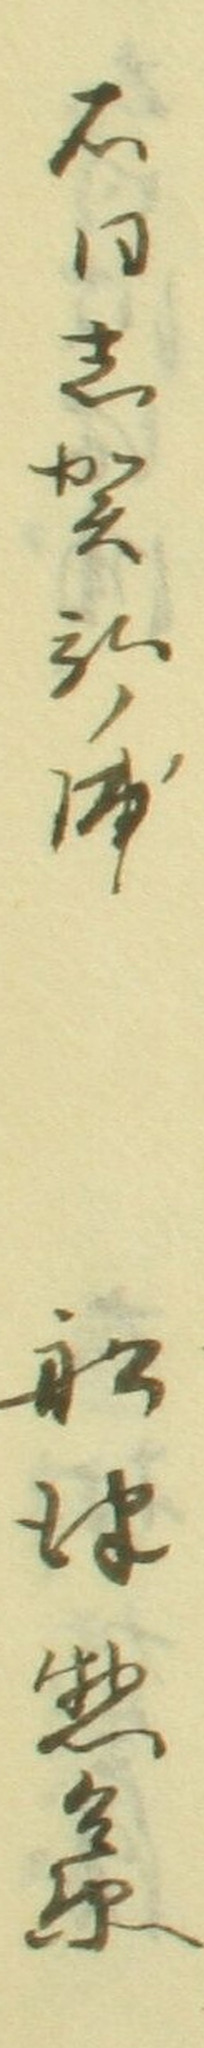右同志賀ノ浦船津惣兵衛

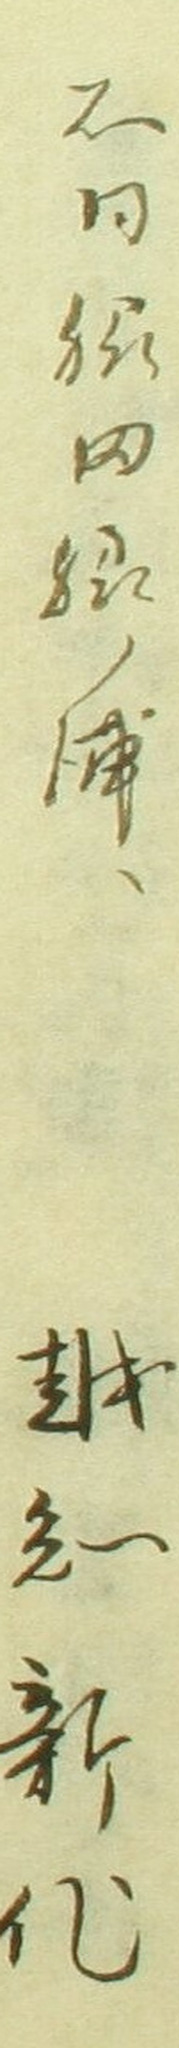右同脇田脇ノ浦、越知新作
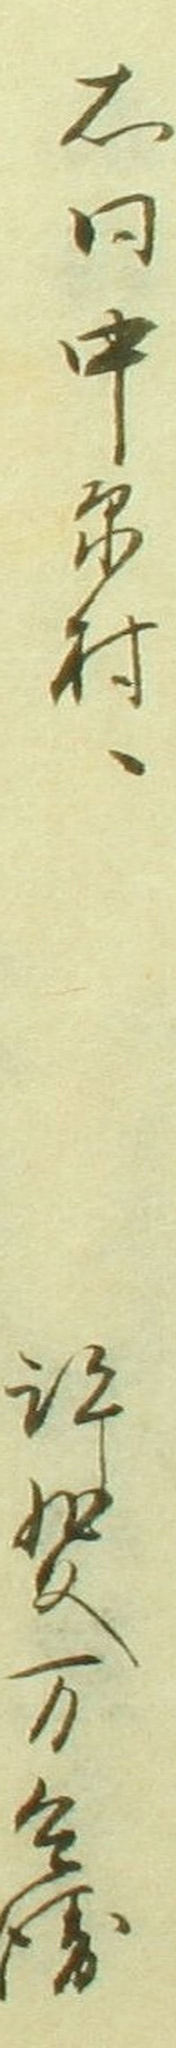右同中原村、評万兵衛
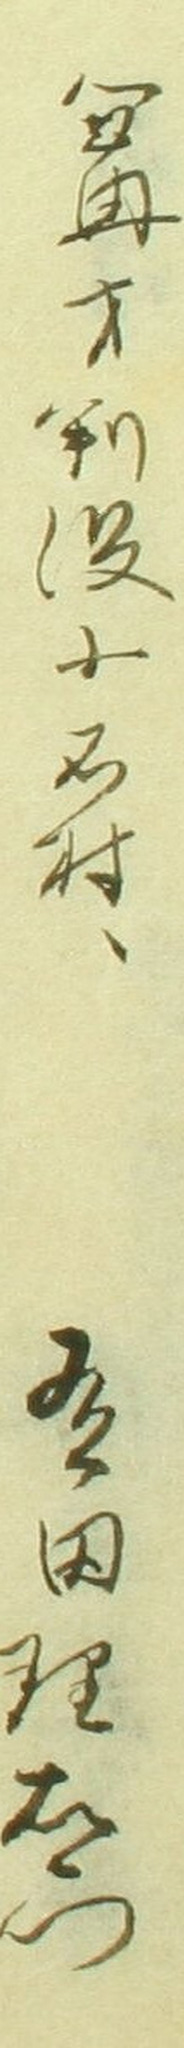盆才別役小石村、有田理右衛門
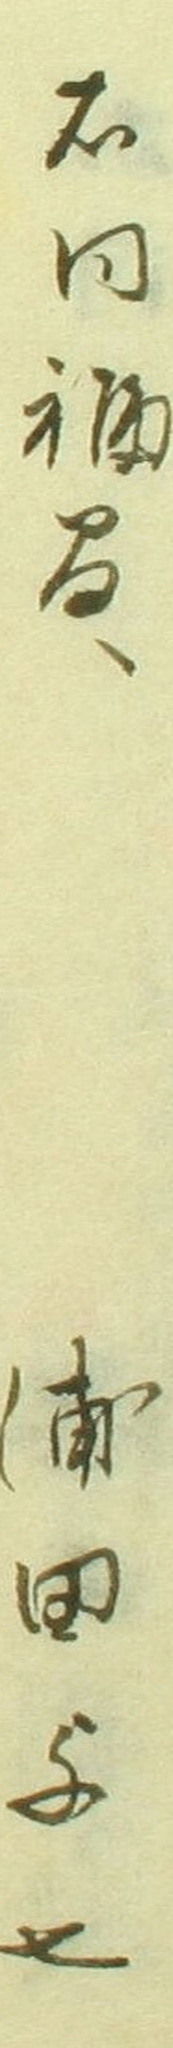右同福間、浦田与七
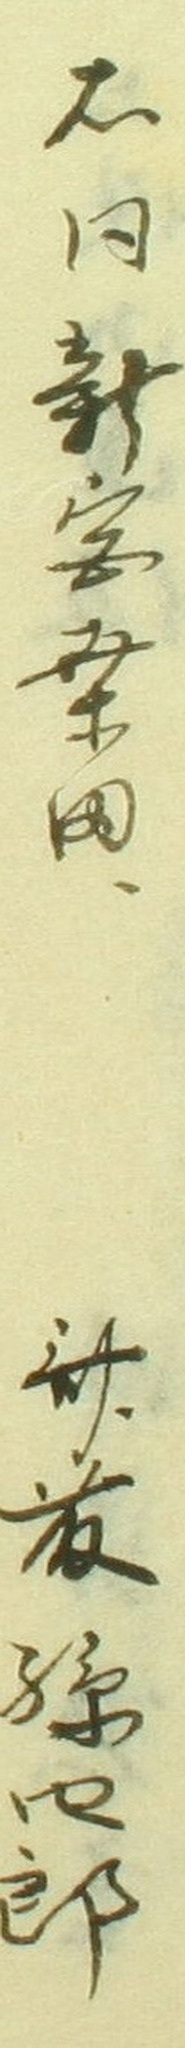右同新宮桑田、斉藤孫四郎
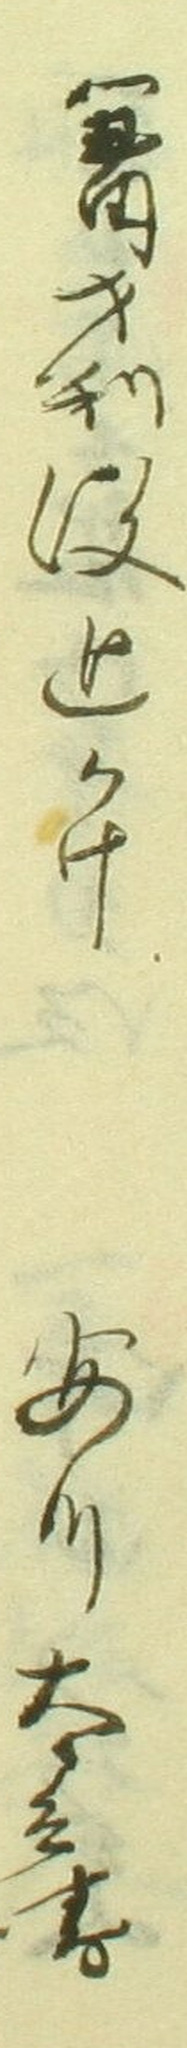盆才別役追かけ安川太郎兵衛
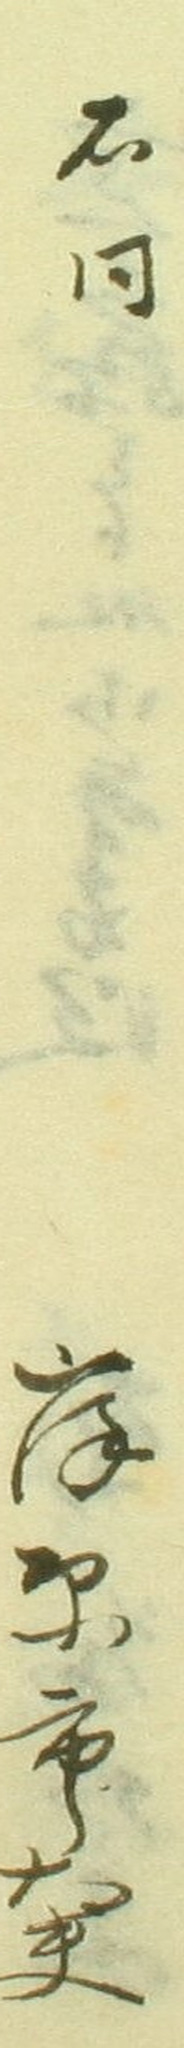右同岸原市太夫
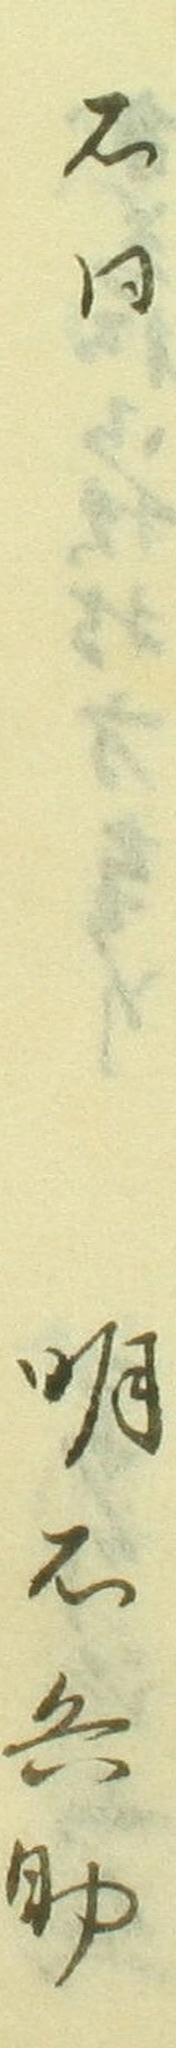右同明石兵助
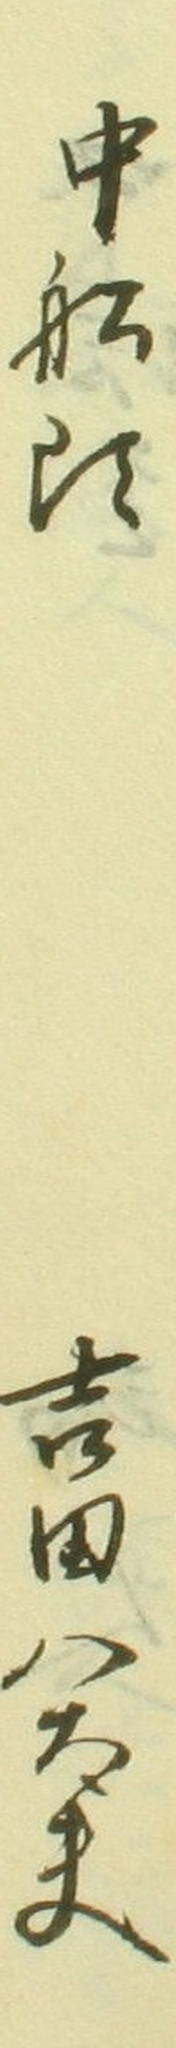中船頭吉田八太夫
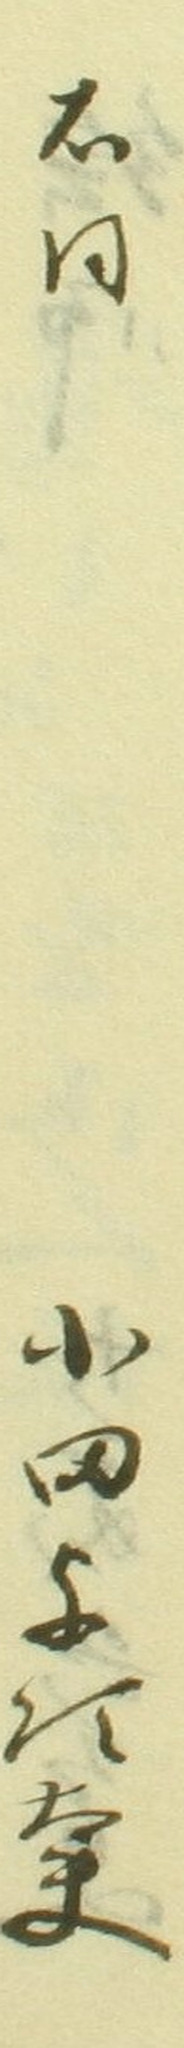右同小田与次太夫
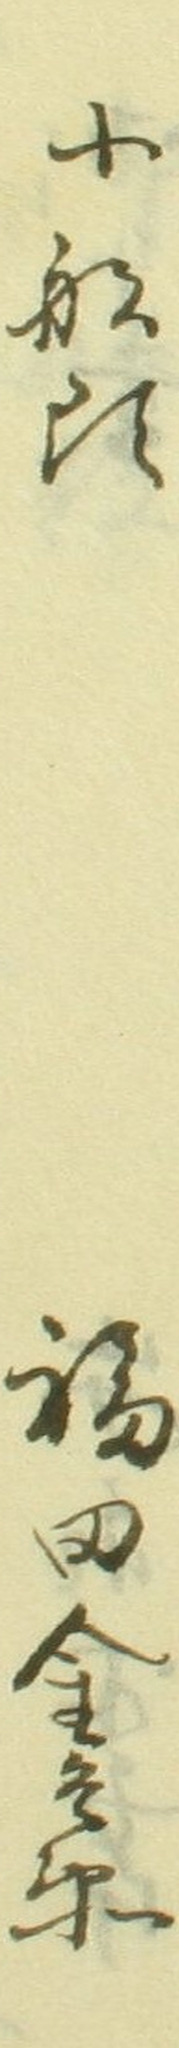小船頭福田金兵衛
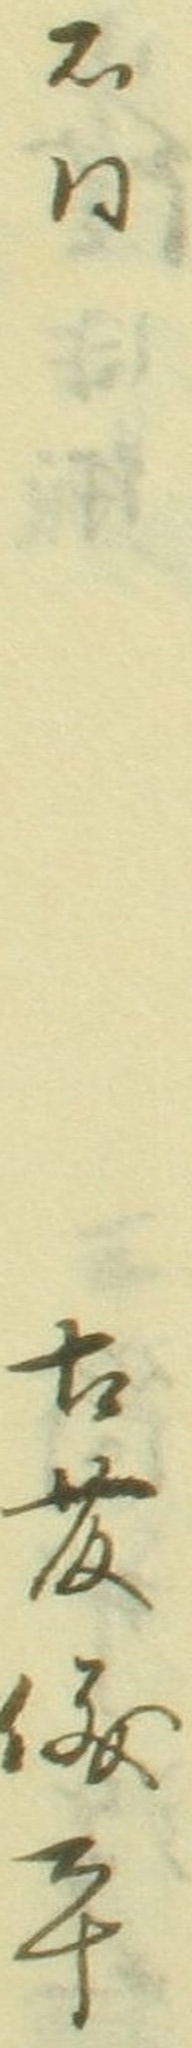右同古藤儀平
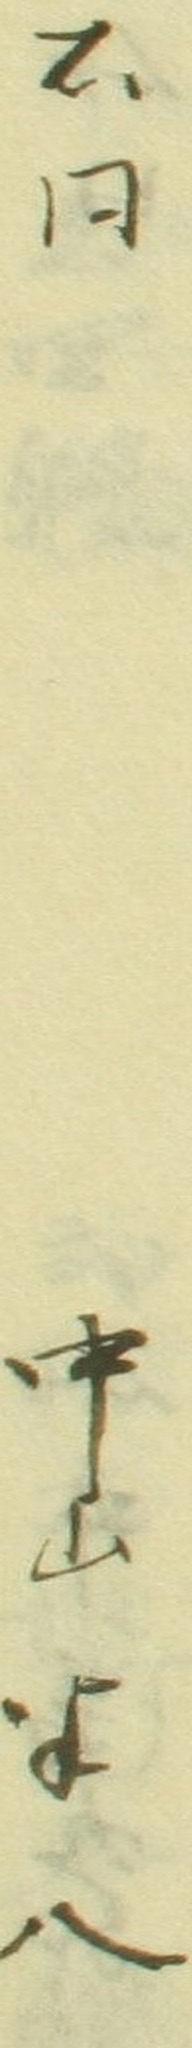右同中山半八

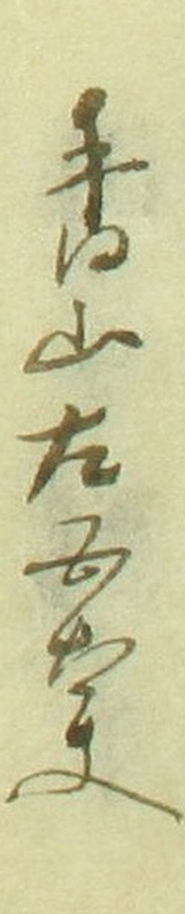右同香山左五太夫
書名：唐船漂流記 二
